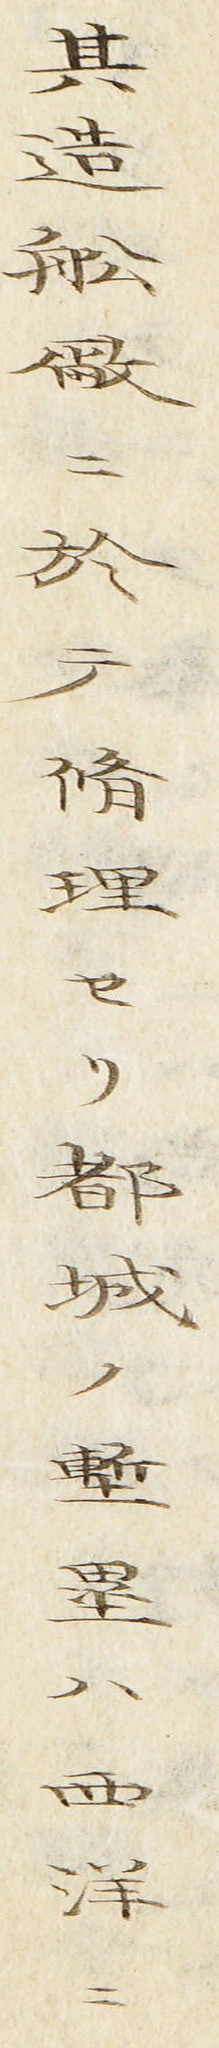其造舩厰ニ於テ修理セリ都城ノ塹塁ハ西洋ニ
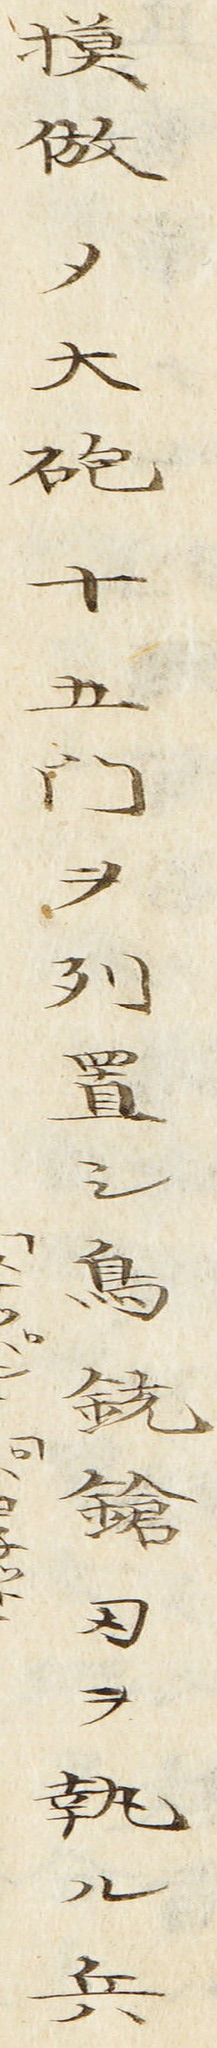模倣シテ大砲十五門ヲ列置シ鳥銃鎗刃ヲ執ル兵
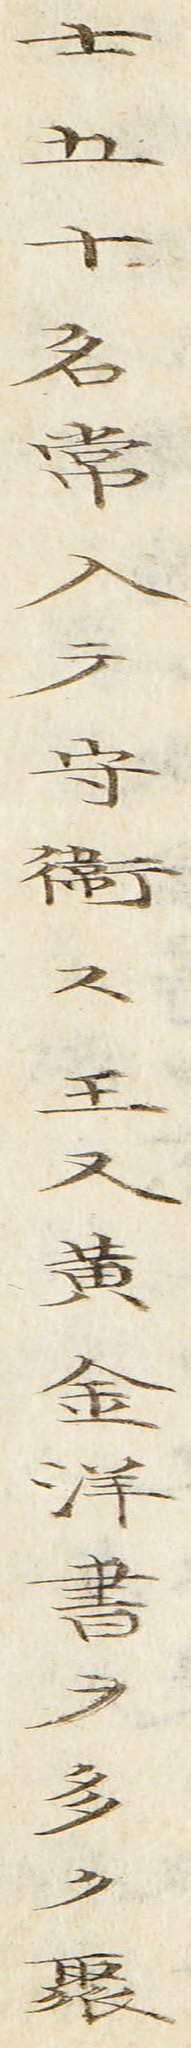士五十名常入テ守衛ス王又黄金洋書ヲ多ク聚
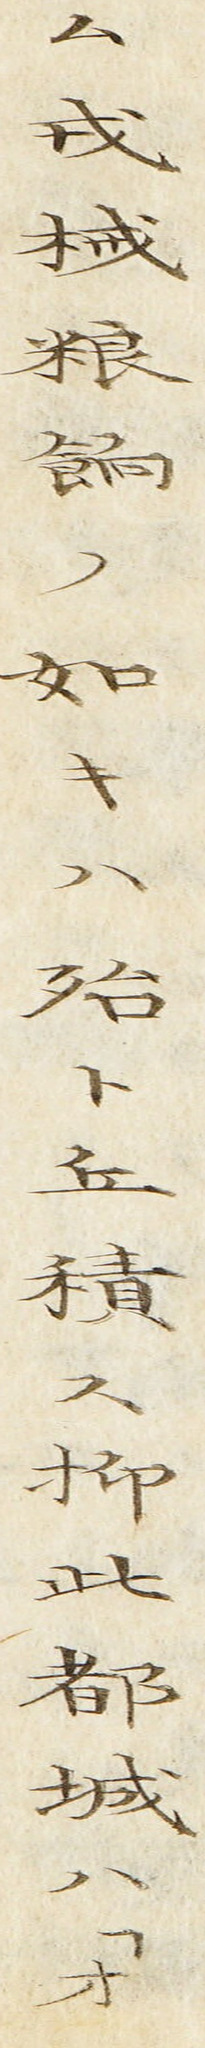ム戎機粮餉ノ如キハ殆ト丘積ス抑此都城ハ「オ
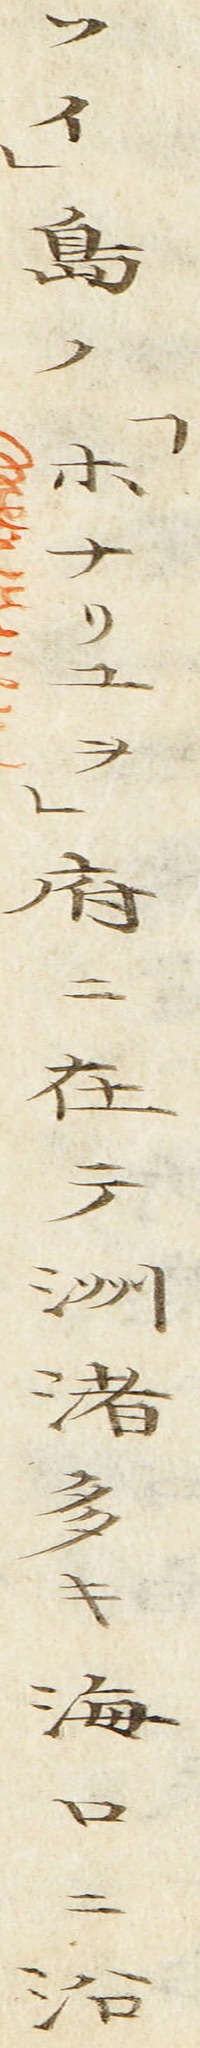ワイ」島ノ「ホナリユヲ」府ニ在テ洲渚多キ海口ニ沿
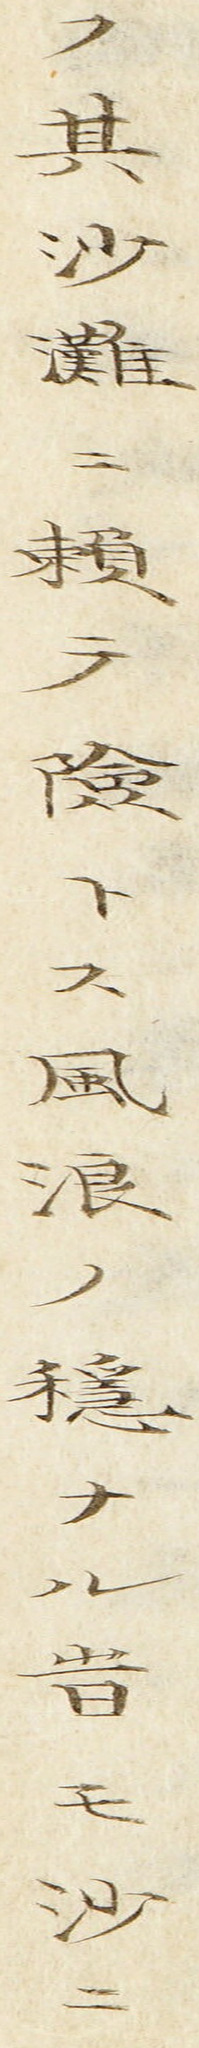フ其沙灘ニ頼テ険トス風浪ノ穏ナル旹モ沙ニ

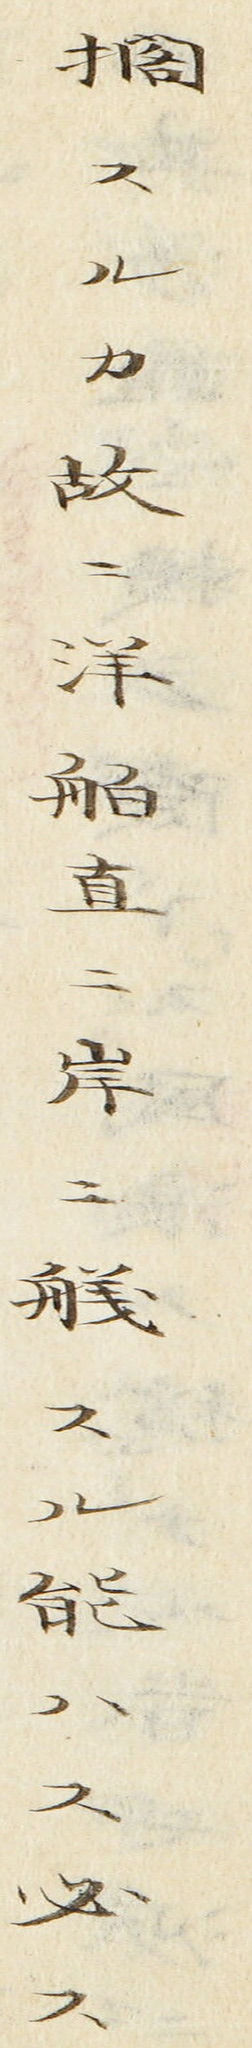擱スルカ故ニ洋舶直ニ岸ニ艤スル能ハス必ス
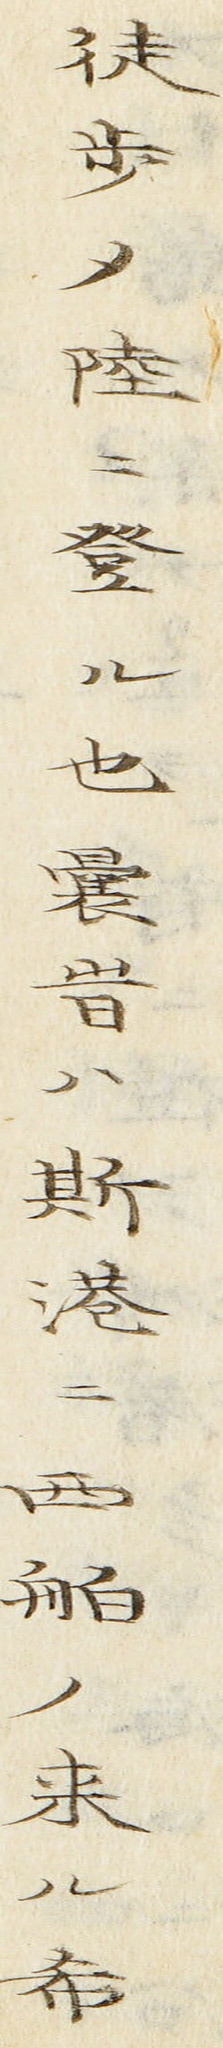徒歩シテ陸ニ登ル也曩旹ハ斯港ニ西舶ノ来ル希
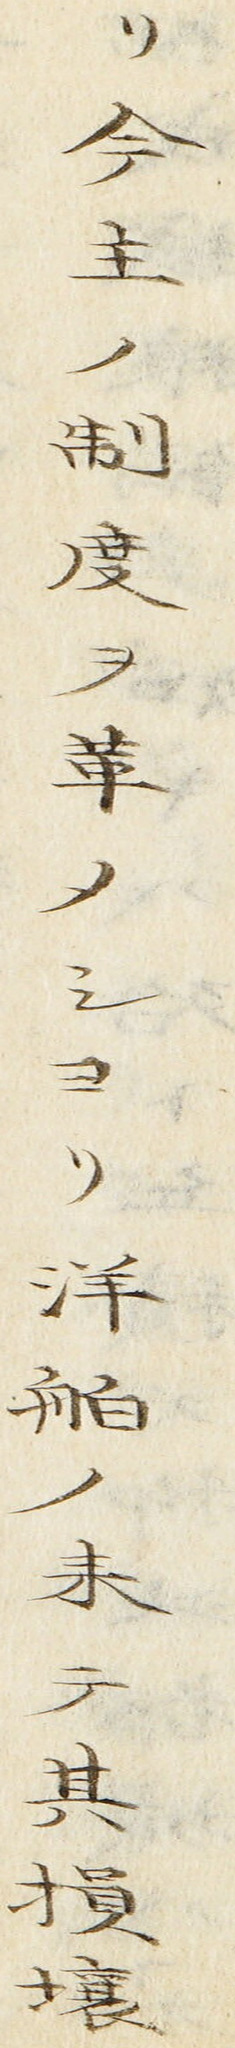リ今主ノ制度ヲ革シテシヨリ洋舶ノ来テ其損壌
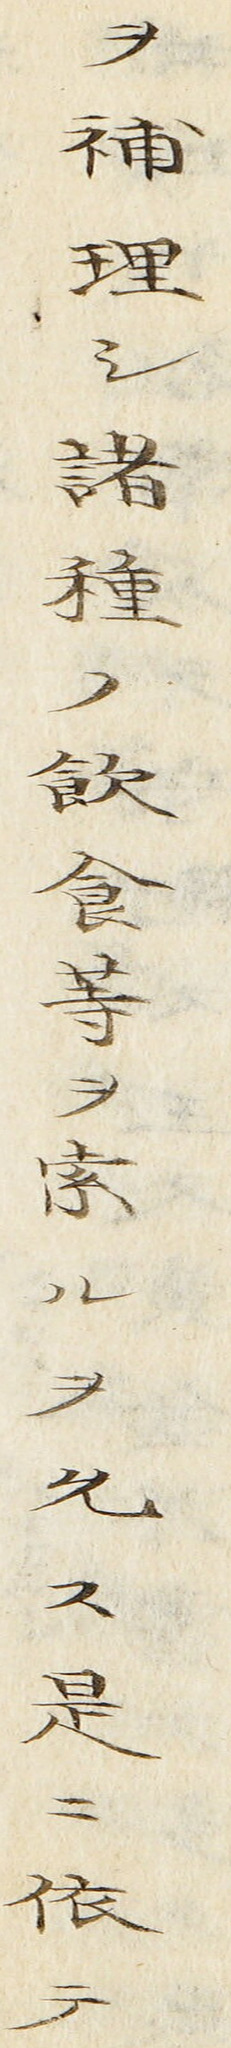ヲ補理シ諸種ノ飲食等ヲ索ルヲ旡？ス是ニ依テ
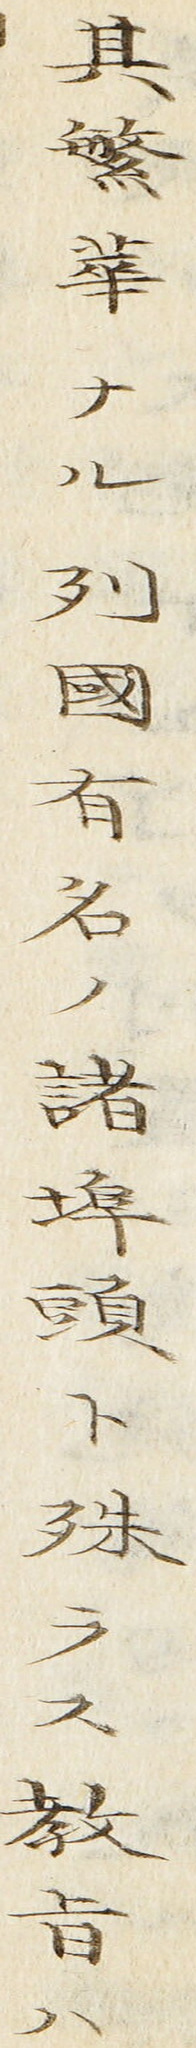其繁華ナル列國有名ノ諸埠頭ト殊ラス教旨ハ
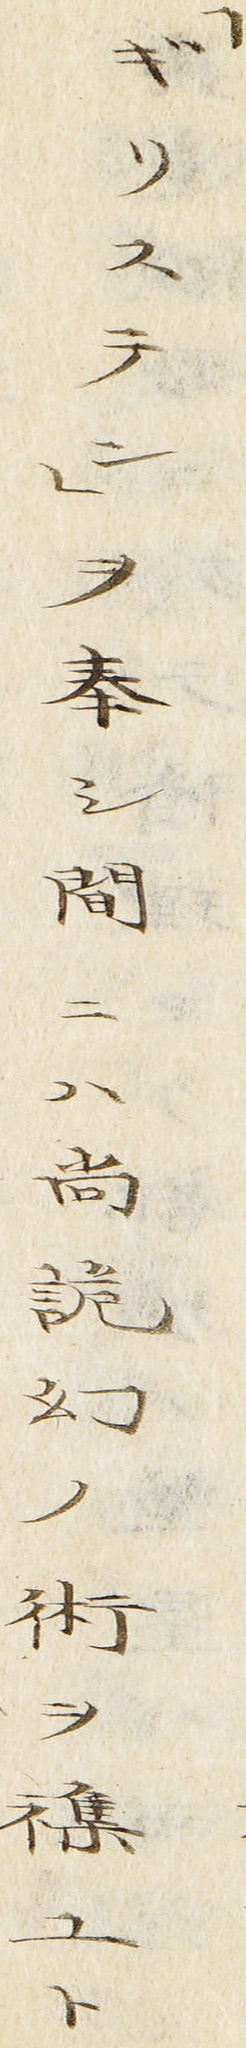「ギリステン」ヲ奉シ間ニハ尚詭幻ノ術ヲ襍ユト
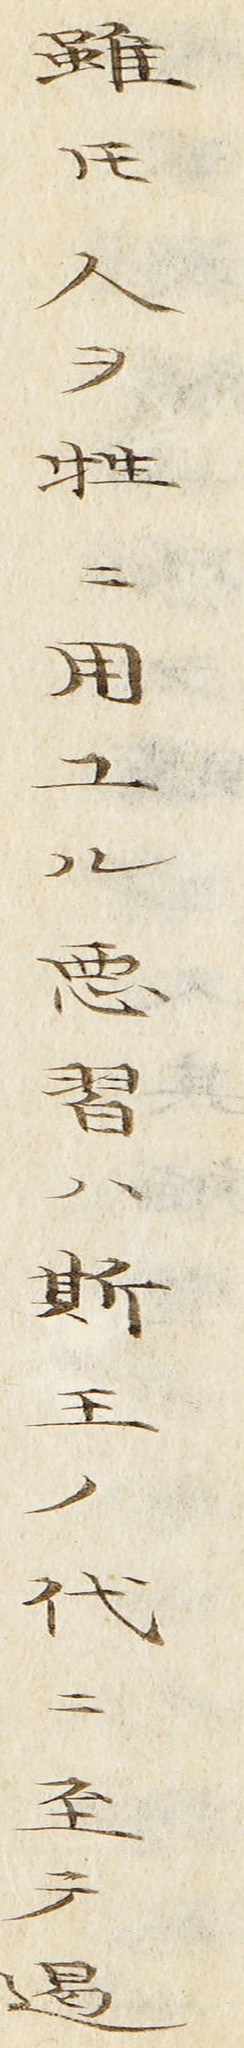雖トモ人ヲ牲ニ用ユル悪習ハ斯王ノ代ニ至テ遏
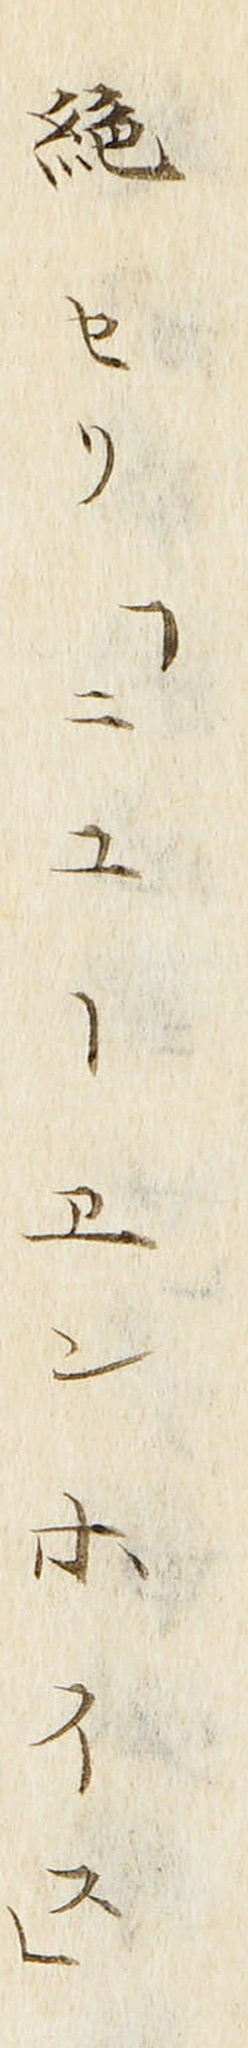絶セリ「ニユーヱンホイス」
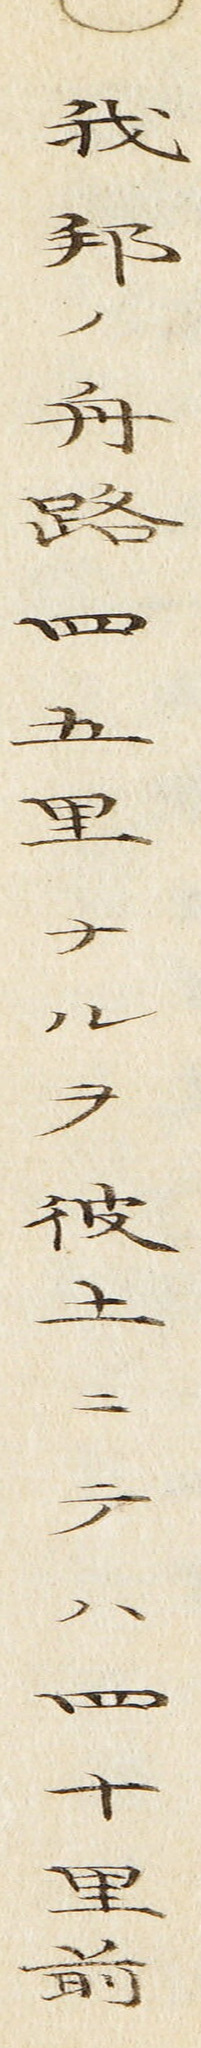〇我邦ノ舟路四五里ナルヲ彼土ニテハ四十里前
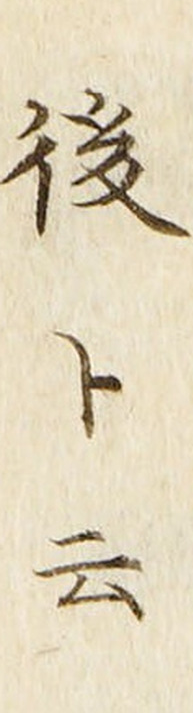後ト云
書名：蕃談
